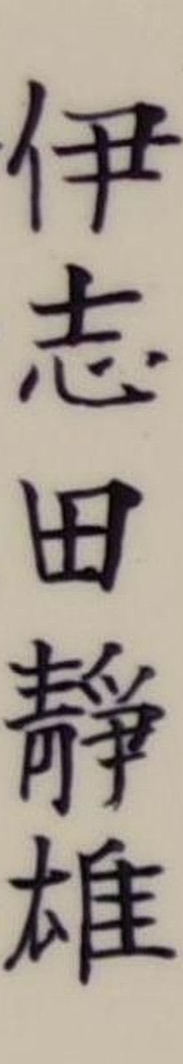伊志田静雄
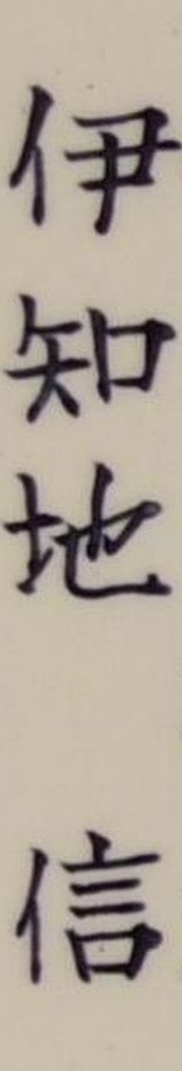伊知地信
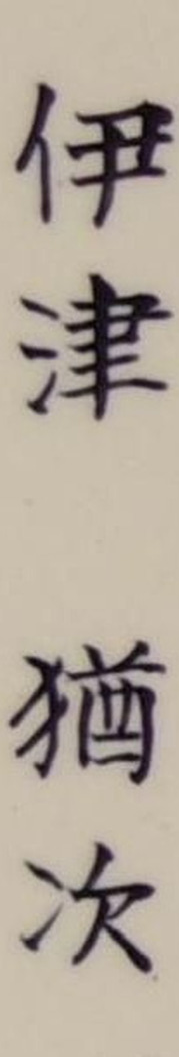伊津猶次
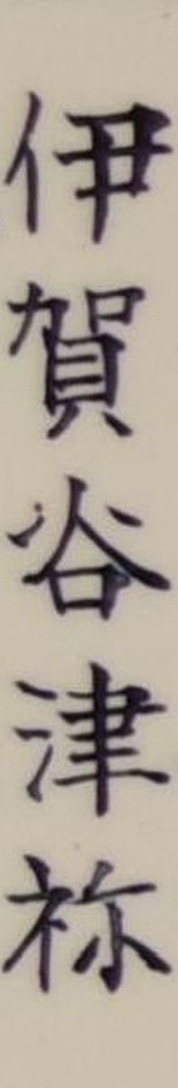伊賀谷つね

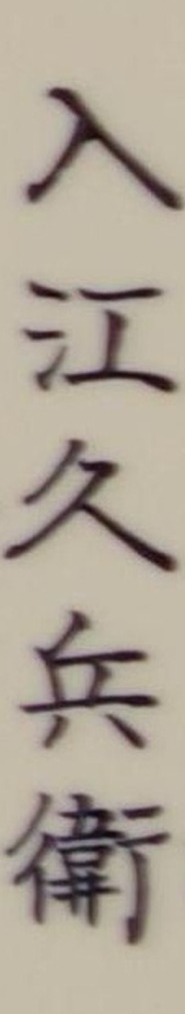入江久兵衛
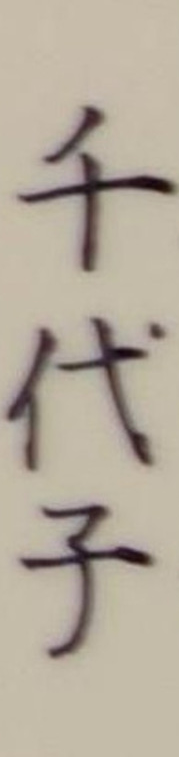千代子
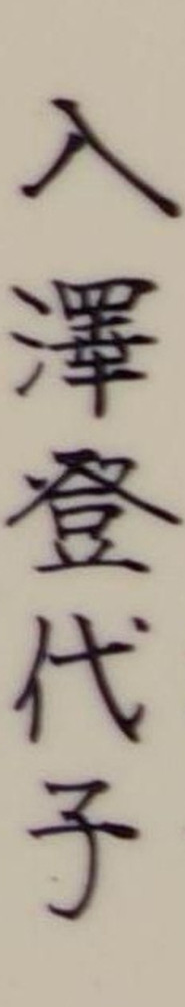入澤登代子
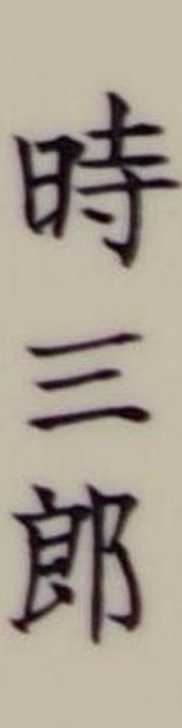時三郎
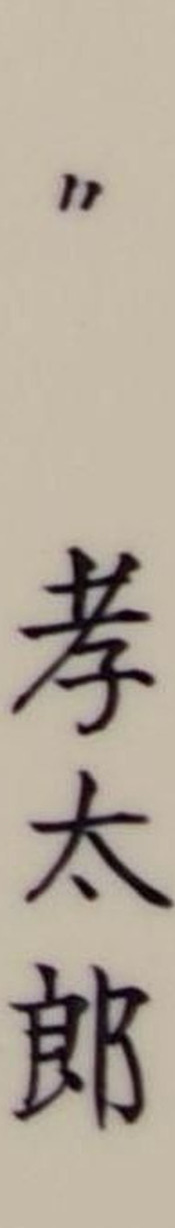孝太郎
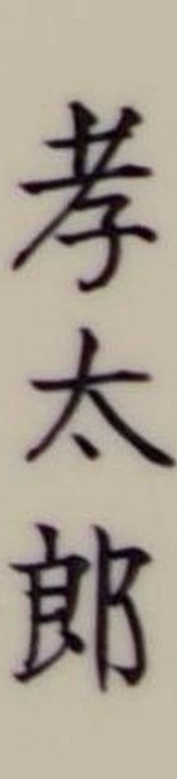孝太郎
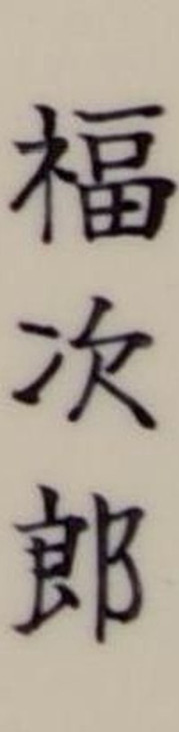福次郎
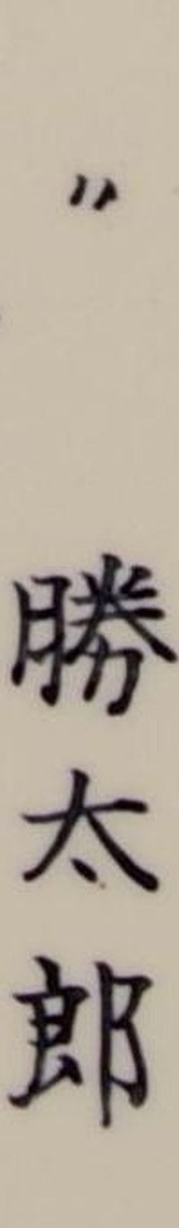勝太郎
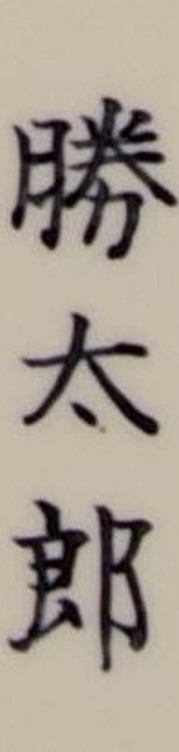勝太郎
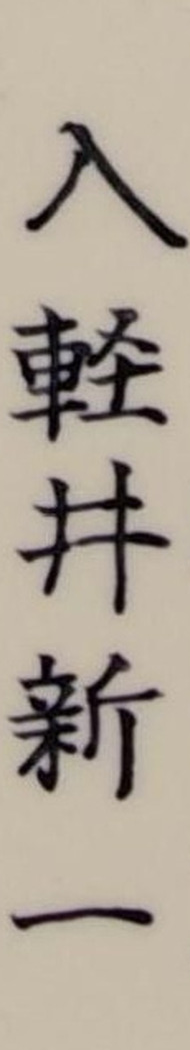入軽井新一
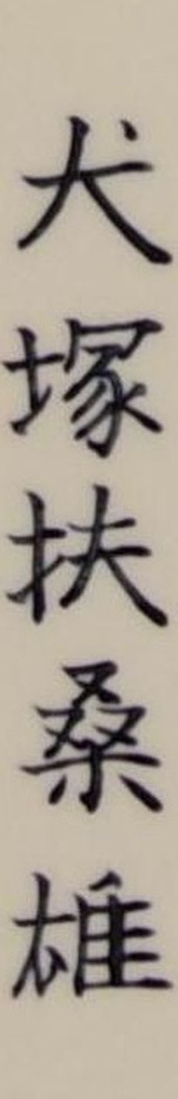犬塚扶桑雄
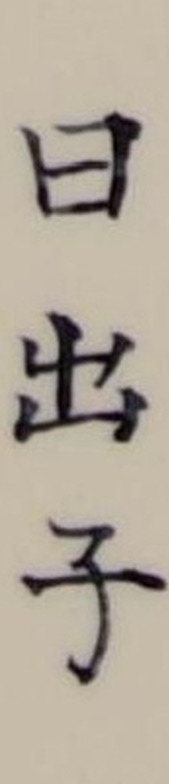日出子
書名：M~S
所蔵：高野山金剛峯寺
